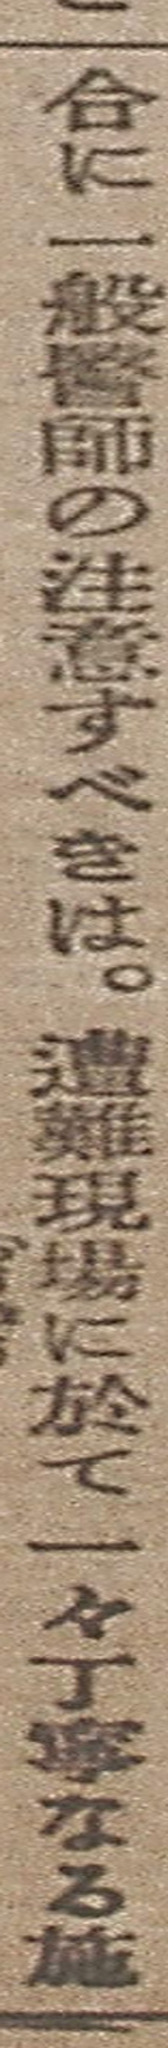合に一般医師の注意すべきは。遭難現場に於て一々丁寧なる施
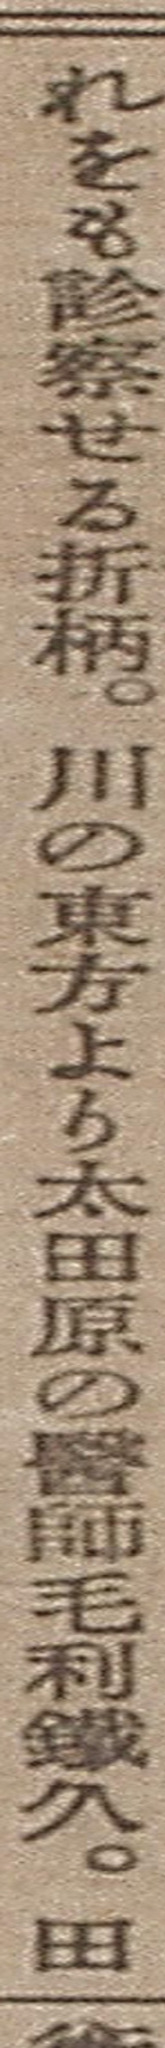れをも診察せる折柄。川の東方より太田原の医師毛利鐵久。田
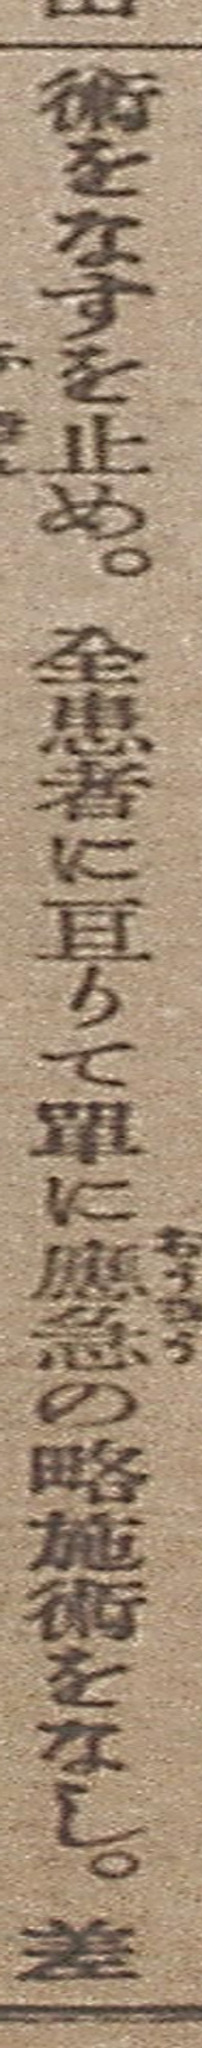術をなすを止め。全患者に亘りて単に応急の略施術をなし。差
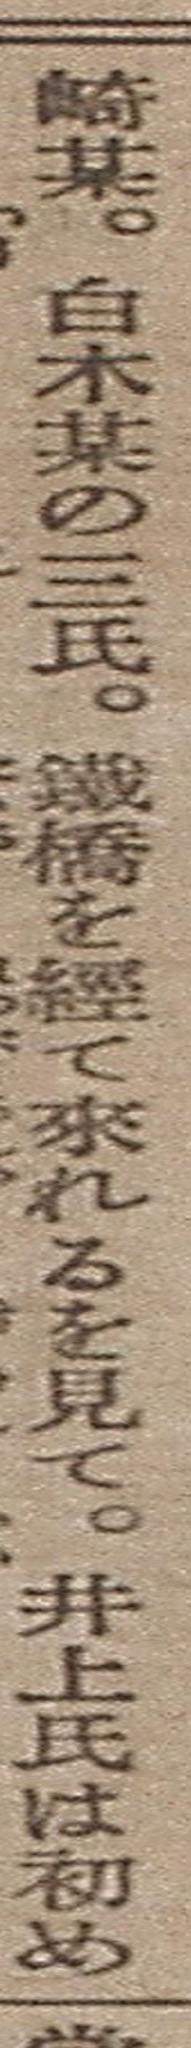崎某。白木某の三氏。鉄橋を経て来れるを見て。井上氏は初め
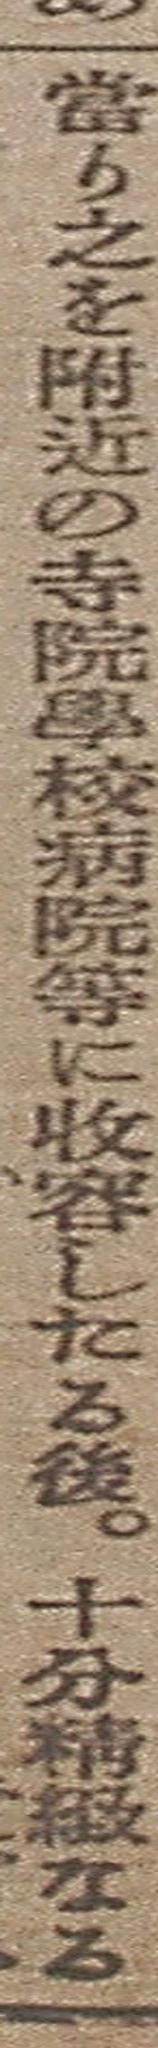当り之を附近の寺院学校病院等に収容したる後。十分精緻なる
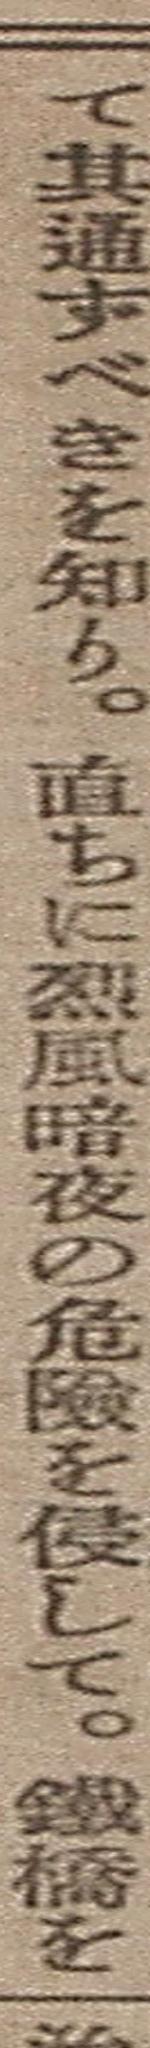て其通ずべきを知り。直ちに烈風暗夜の危険を侵して。鉄橋を
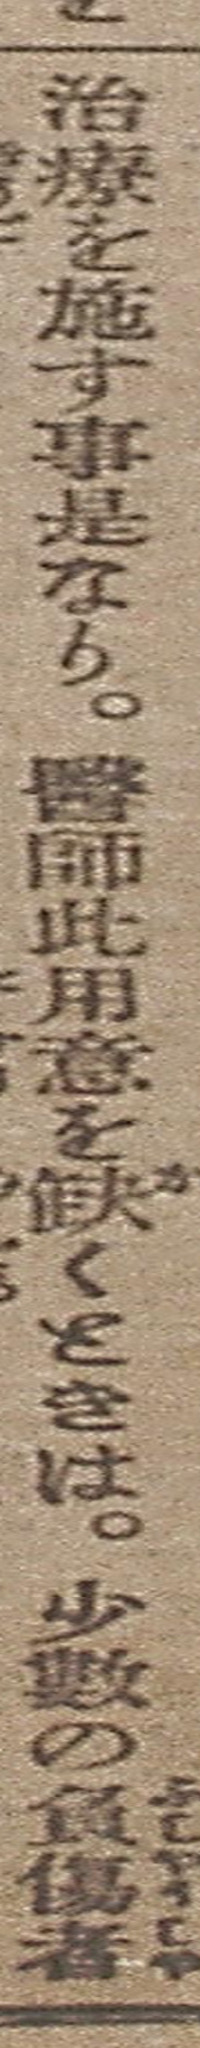治療を施す事是なり。医師此用意を缺くときは。少数の負傷者
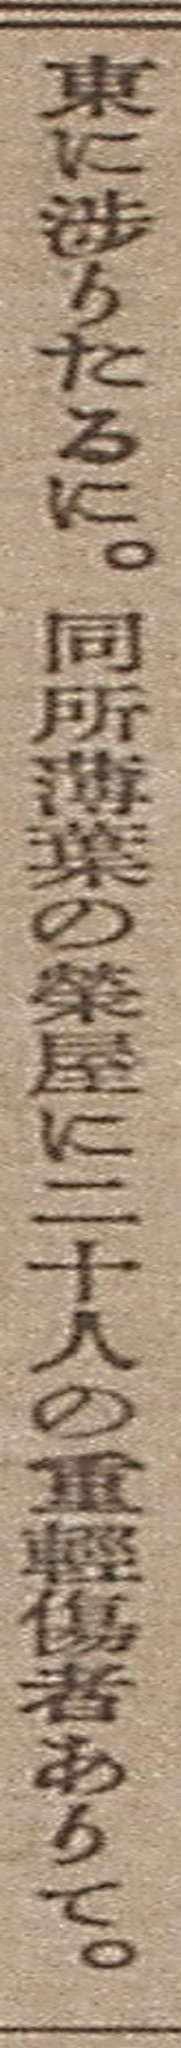東に渉りたるに。同所薄葉の栄屋に二十人の重軽傷者ありて。
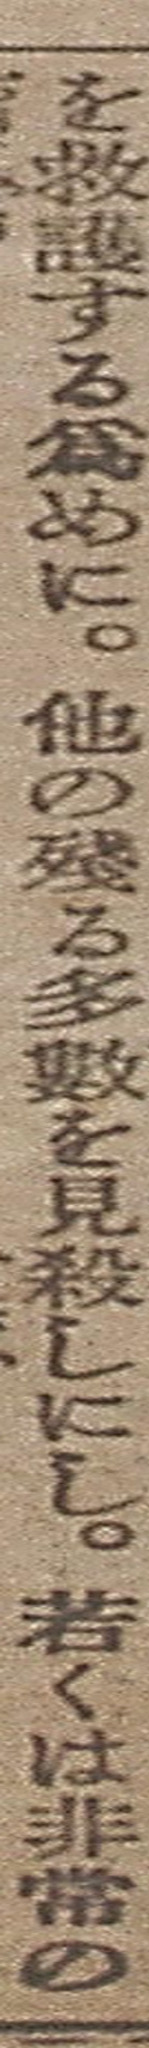を救護する為めに。他の残る多数を見殺しにし。若くは非常の
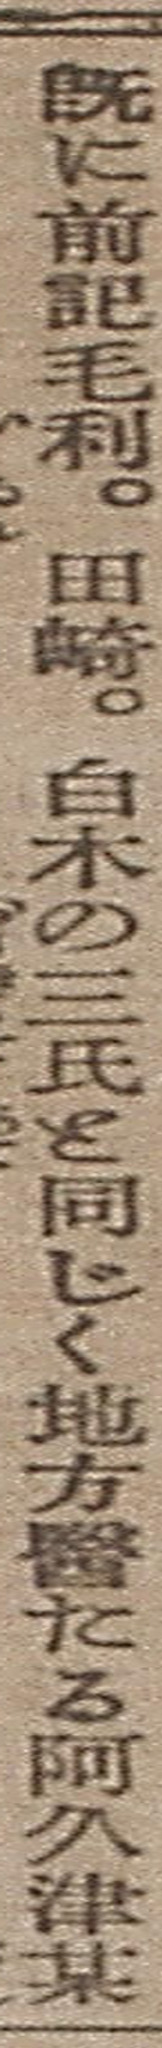既に前記毛利。田崎。白木の三氏と同じく地方医たる阿久津某
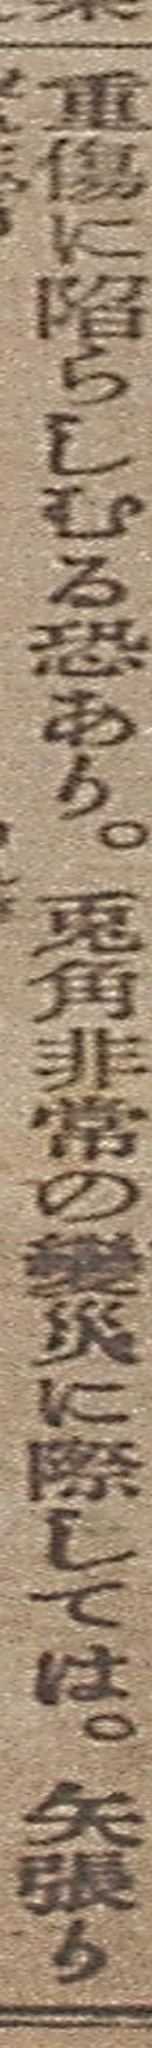重傷に陥らしむる恐あり。兎角非常の変災に際しては。矢張り
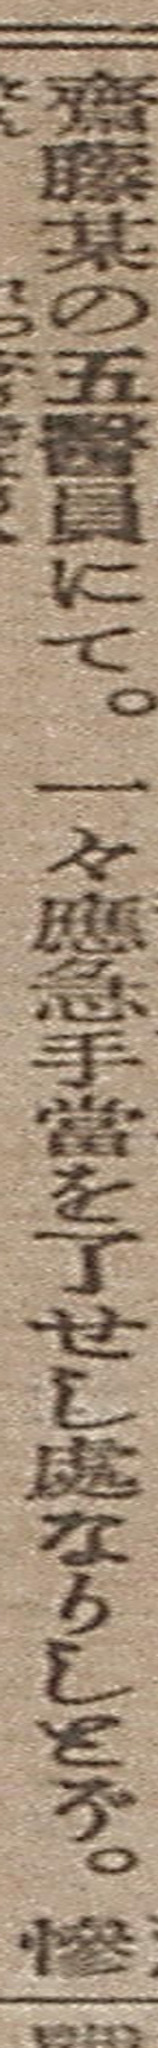齊藤某の五医員にて。一々応急手当を了せし処なりしとぞ。惨
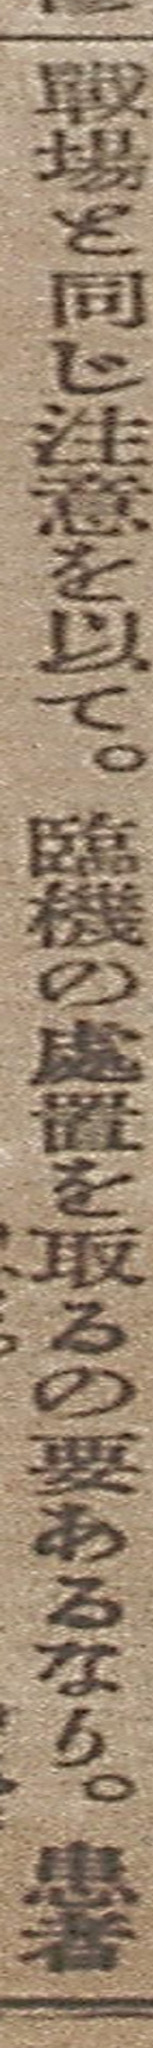戦場と同じ注意を以て。臨機の処置を取るの要あるなり。患者
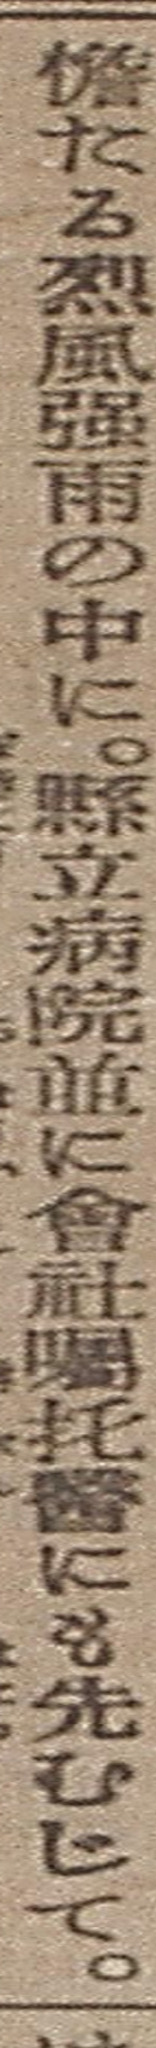憺たる烈風強雨の中に。県立病院並に会社嘱託医にも先むじて。
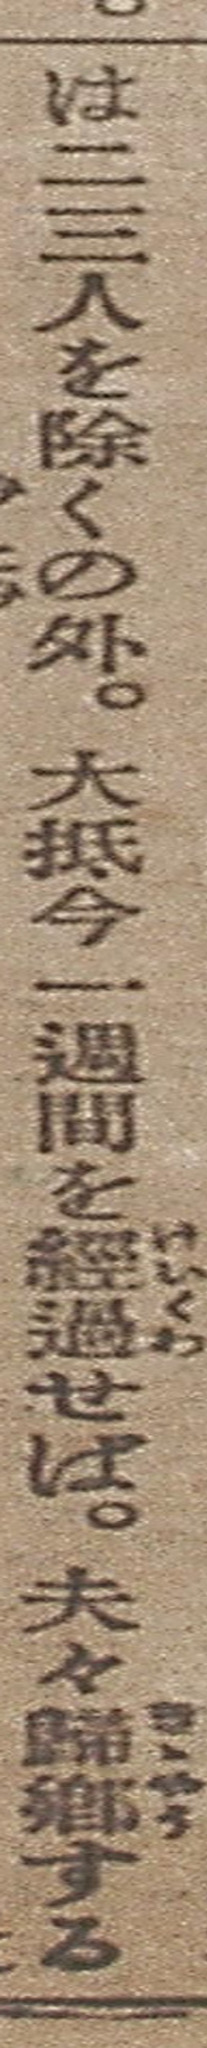はニ三人を除くの外。大抵今一週間を経過せば。夫々帰郷する
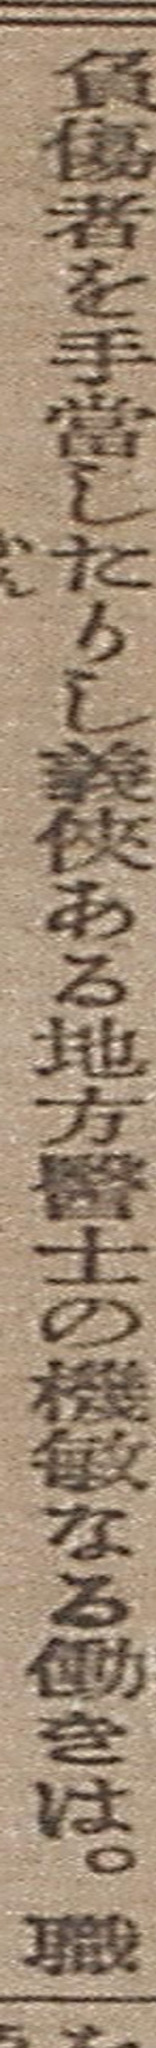負傷者を手当したりし義侠ある地方医士の機敏なる働きは。職
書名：風俗畫報臨時増刊第百九十九號　明治三十二年十月各地災害圖會（前編之續）
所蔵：東京大学地震研究所図書室 Earthquake Research Institute Library, The University of Tokyo, JAPAN
